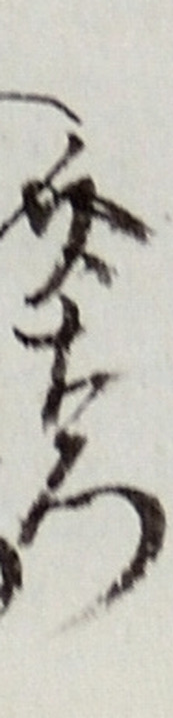孫右衛門
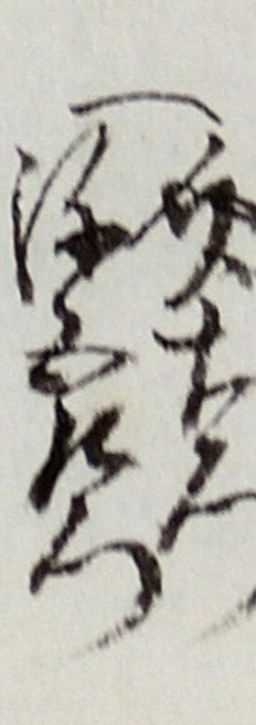弥五左衛門
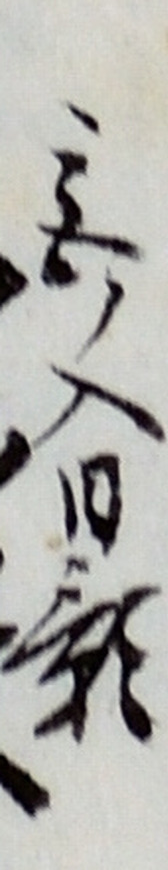宮ノ入日影
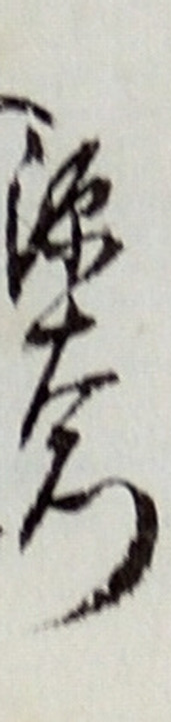孫右衛門
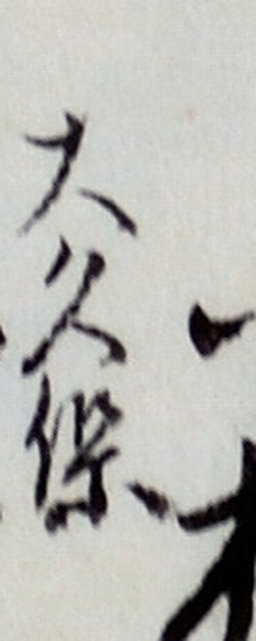大久保
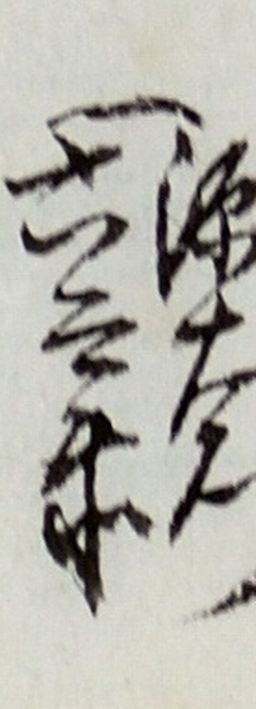六兵衛
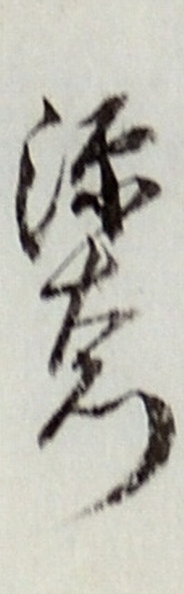孫右衛門
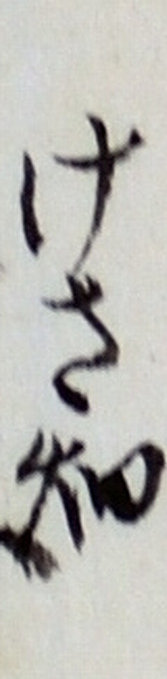けさ畑
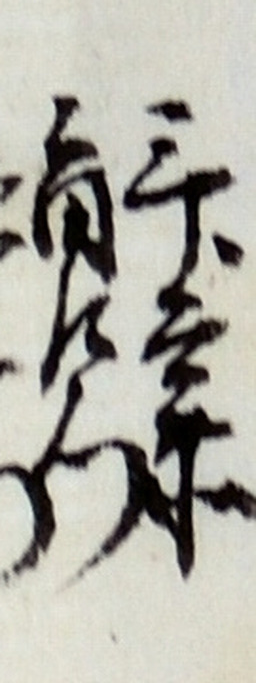杢左衛門
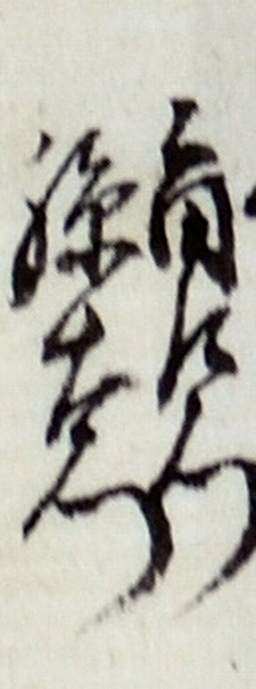孫右衛門
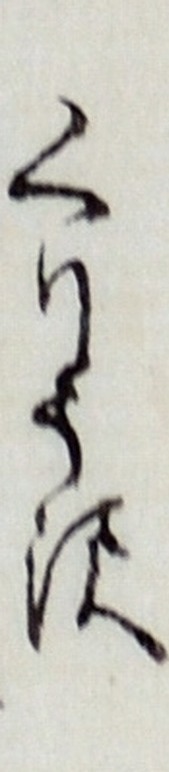くりう沢
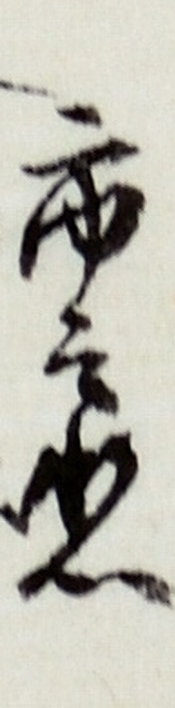勘兵衛
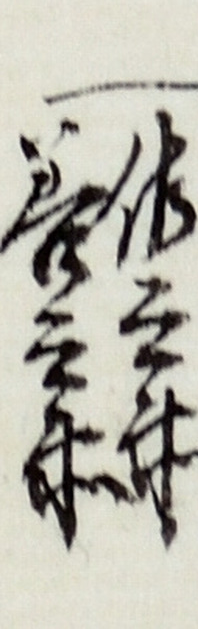善兵衛
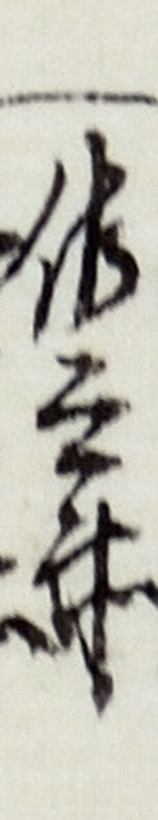佐兵衛
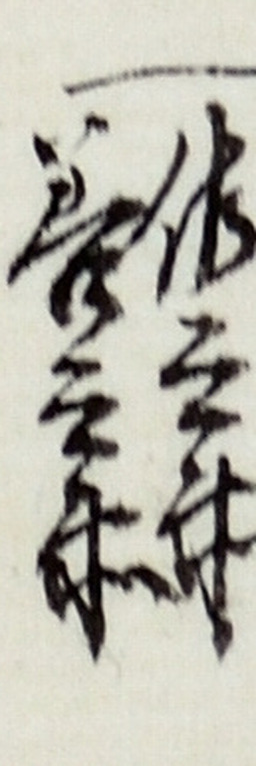善兵衛
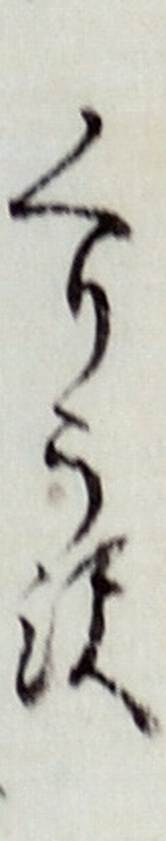くりう沢
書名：御領分中山林社地手控
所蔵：伊那市立高遠町図書館・合同会社AMANE
